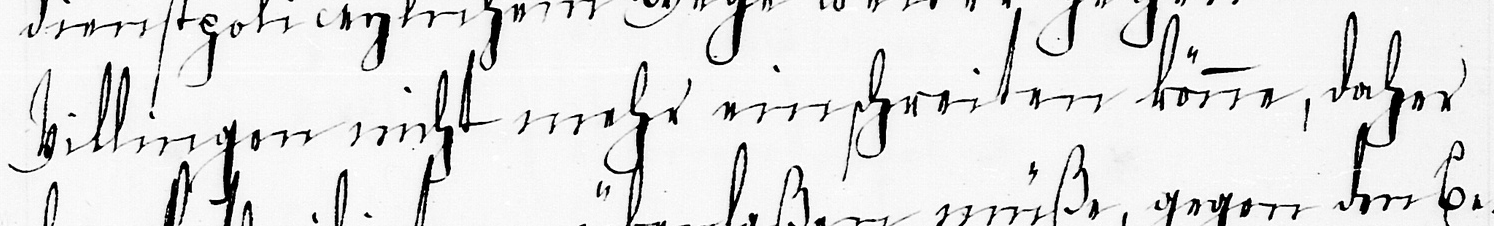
Villingen nicht mehr einschreiten könne, daher
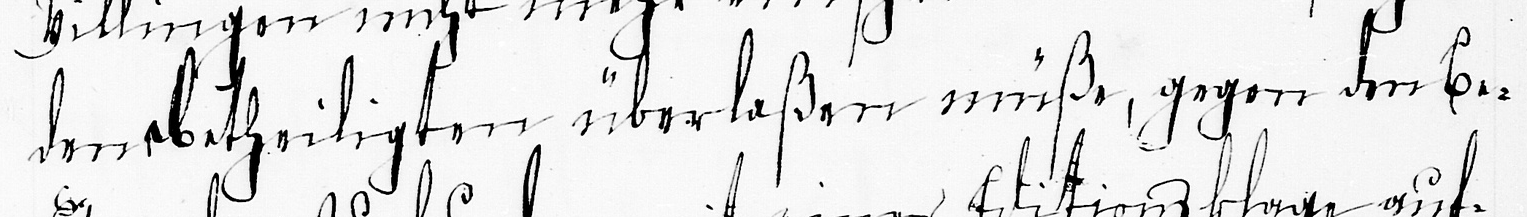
den Betheiligten überlaßen müße, gegen den Be¬
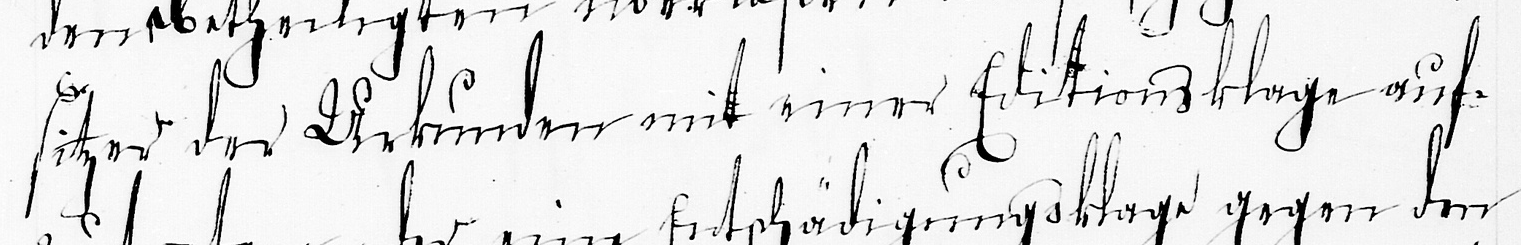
sitzer der Urkunden mit einer Editionsklage auf¬
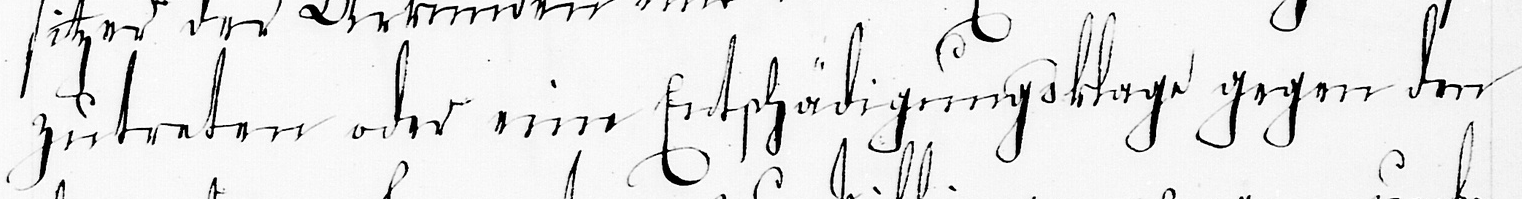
zutreten oder eine Entschädigungsklage gegen den
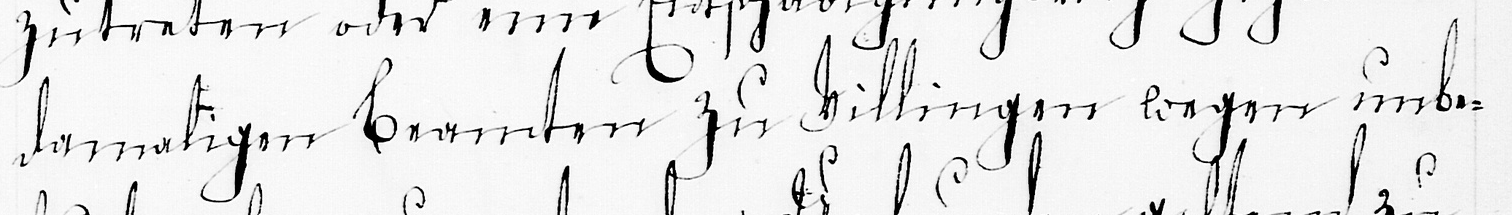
damaligen Beamten zu Villingen wegen unbe¬
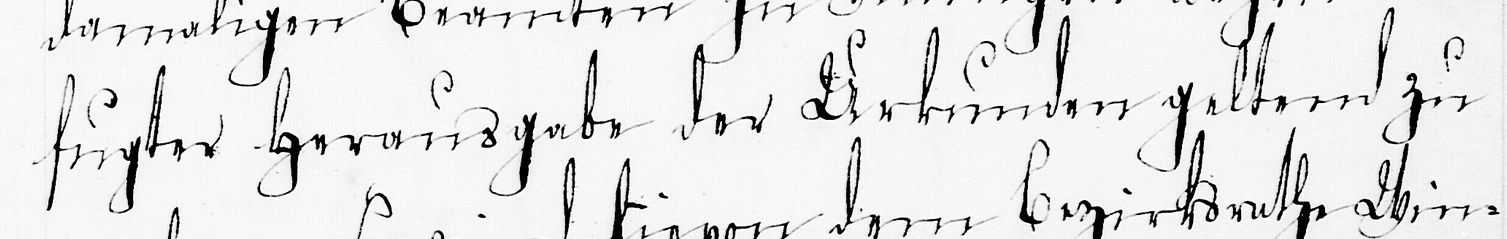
fugter Herausgabe der Urkunden geltend zu
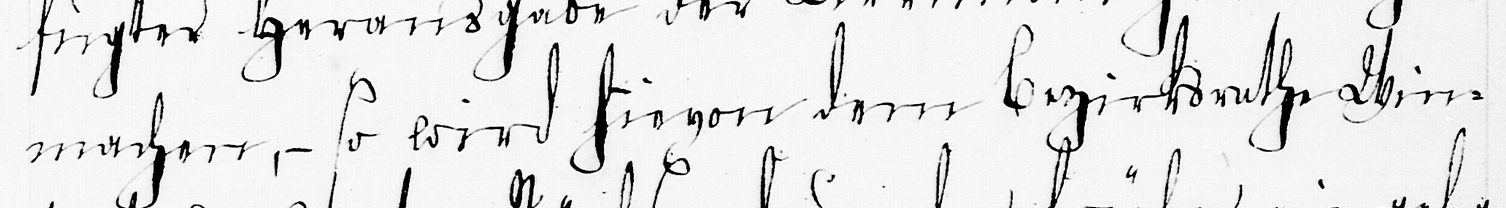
machen, – so wird hievon dem Bezirksrathe Win¬
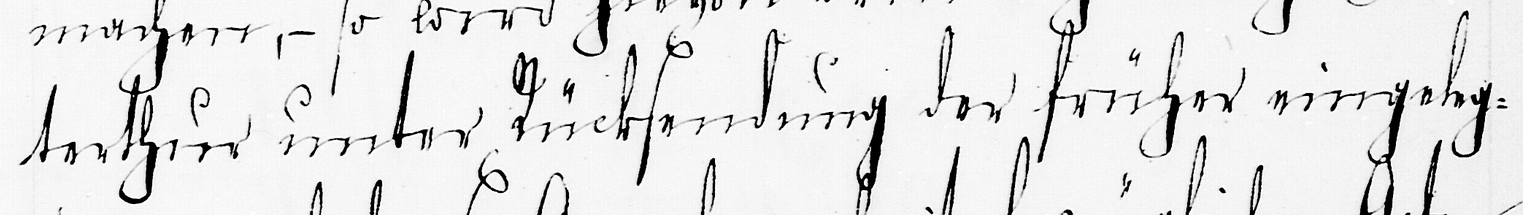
terthur unter Rücksendung der früher eingeleg¬
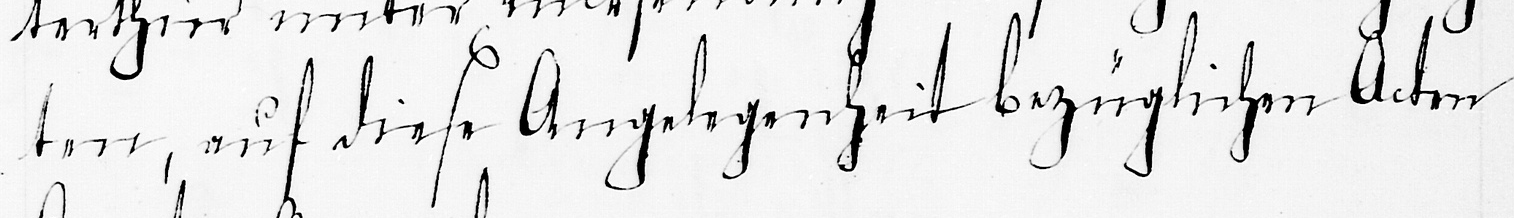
ten, auf diese Angelegenheit bezüglichen Acten
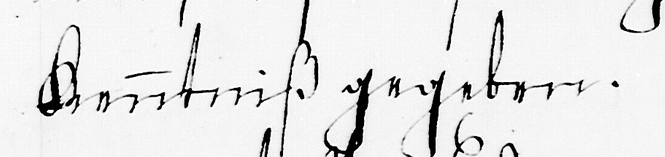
Kenntniß gegeben.
